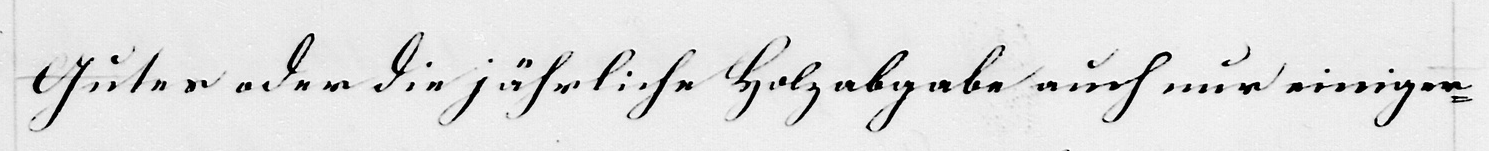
Gutes oder die jährliche Holzabgabe auch nur einiger¬
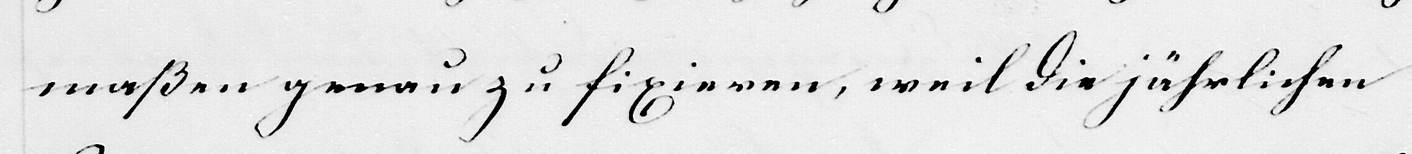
maßen genau zu fixieren, weil die jährlichen
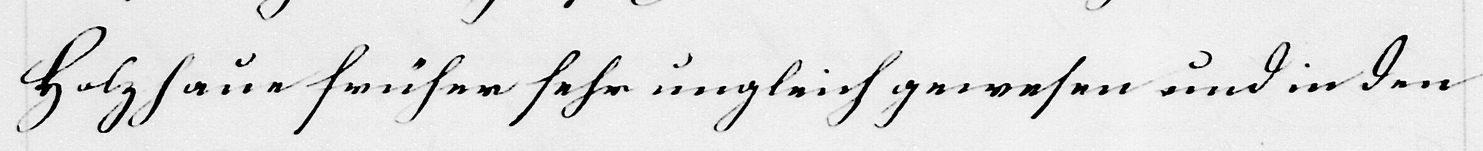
Holzhaue früher sehr ungleich gewesen und in den
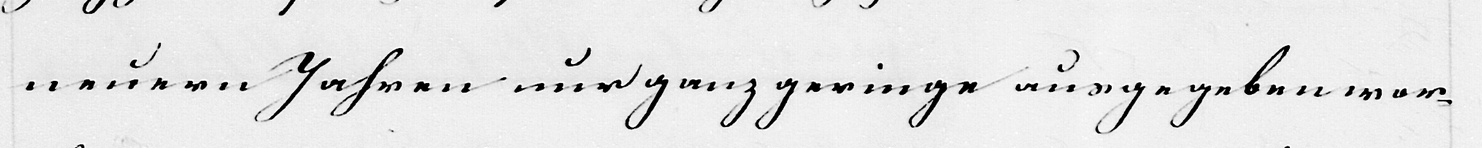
neuern Jahren nur ganz geringe ausgegeben wor¬
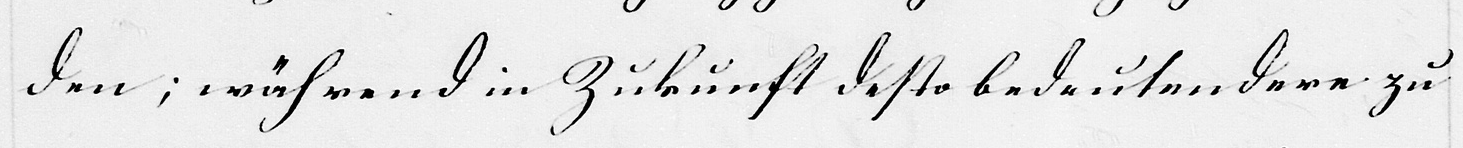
den; während in Zukunft desto bedeutendere zu
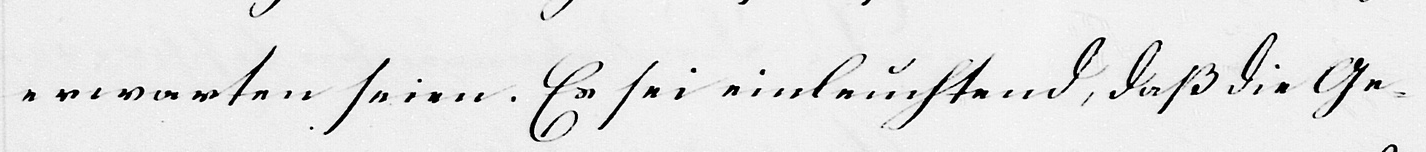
erwarten seien. Es sei einleuchtend, daß die Ge¬
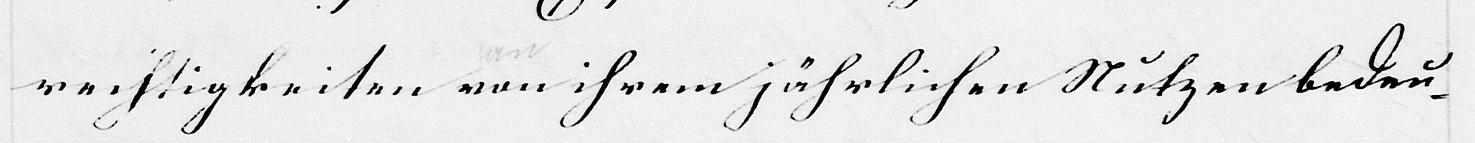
rechtigkeiten von ihrem jährlichen Nutzen bedeu¬
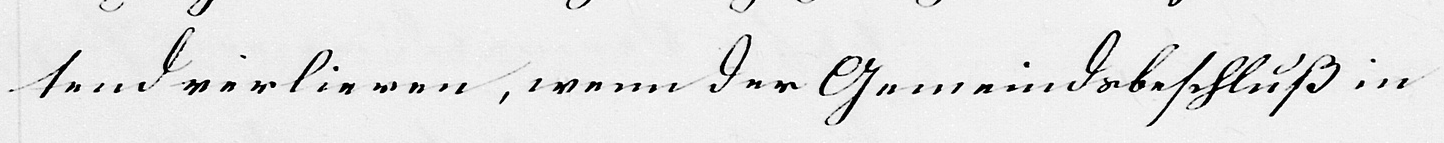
tend verlieren, wenn der Gemeindsbeschluß in
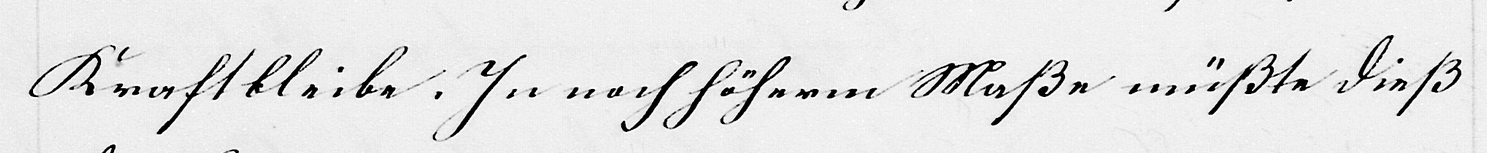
Kraft bleibe. In noch höherm Maße müßte dieß
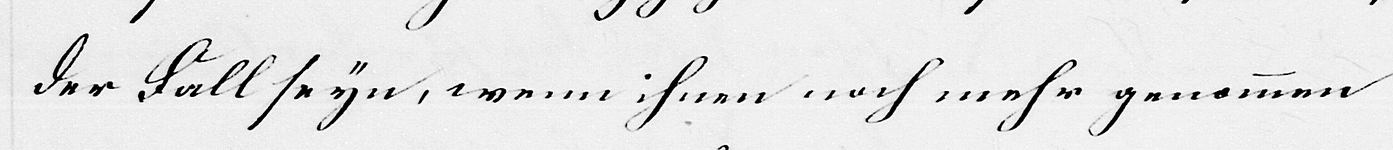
der Fall seyn, wenn ihnen noch mehr genommen
